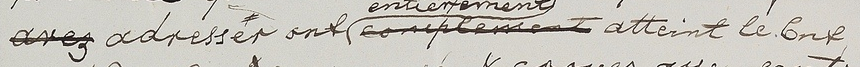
avez adresséer ont complemententièrement atteint le but,
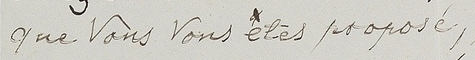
que Vous Vous êtes proposé, &
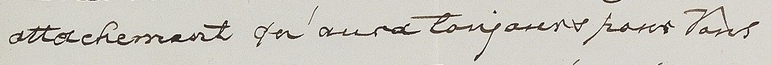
attachement qu'aura toujours pour Vous
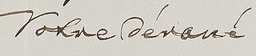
Votre dévoué
